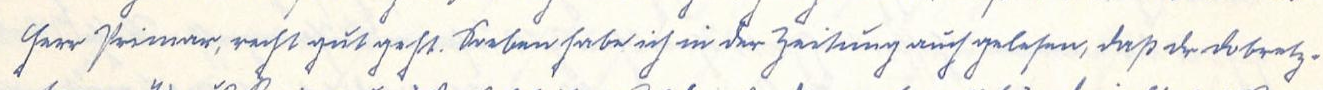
Herr Primar, recht gut geht. Soeben habe ich in der Zeitung auch gelesen, daß Dr Dobretz-
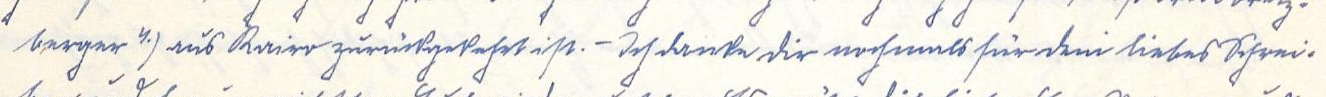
berger 4) aus Kairo zurückgekehrt ist. Ich danke dir nochmals für dein liebes Schrei-
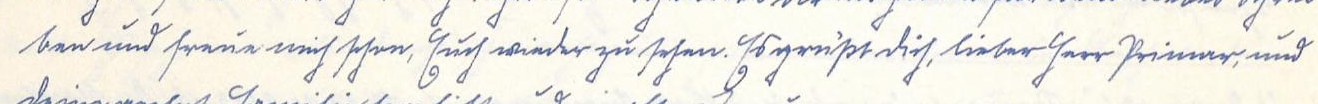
ben und freue mich schon, Euch wieder zu schen. Es grüßt dich lieber Herr Primar, und
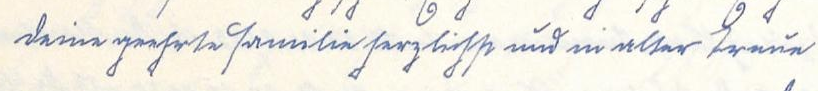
deine geehrte Hamilie herzlichst und in alter Treue
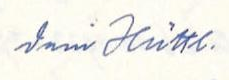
dein Hüttl.
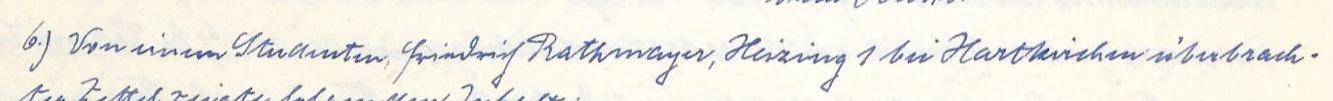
6) Von einen Studenten, Friedrich Rathmayer, Hirzing 1 bei Hartkichen überbrach-
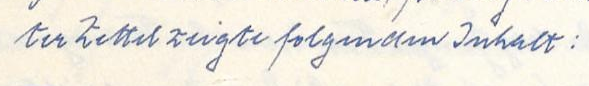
ter Zettel zeigte folgenden Inhalt:
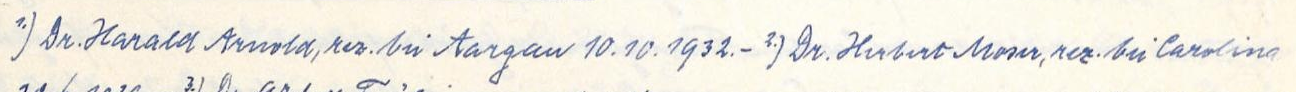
1) Dr. Harald Arnold, rez. bei Aargau 10. 10.1932.- 2) Dr. Herbert Moser, rez. bei Carolina
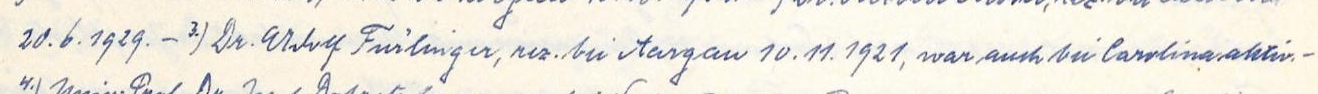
20.6. 1929. 3) Dr. Adolf Fürlinger rez. bei Aargau 10.11.1921, war auch bei Carolina aktiv
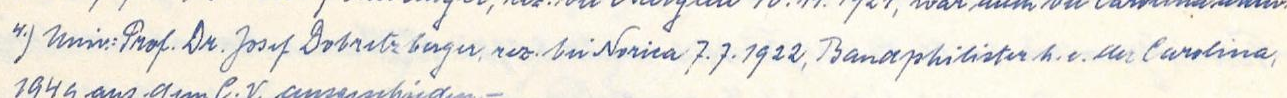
4.) Univ Prof. Dr. Josef Dobretzberger, rez. bei Norica 7.7. 1922, Bandphilister h. c. der Carolina,
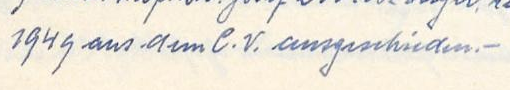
1949 aus dem C. V ausgeschieden.
